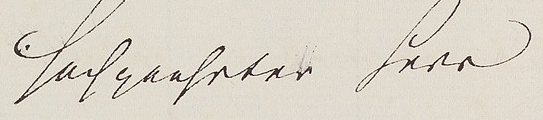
Hochgeehrter Herr
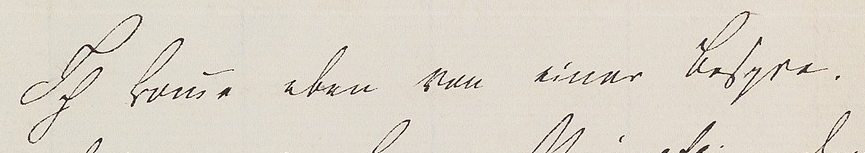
Ich komme eben von einer Bespre-
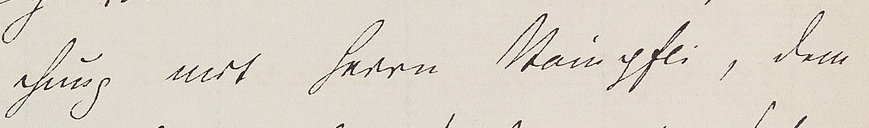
chung mit Herrn Stämpfli , dem
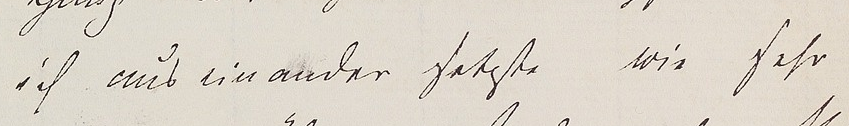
ich auseinander setzte wie sehr
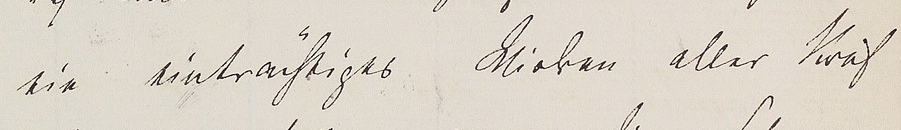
ein einträchtiges Wirken aller Kräf-
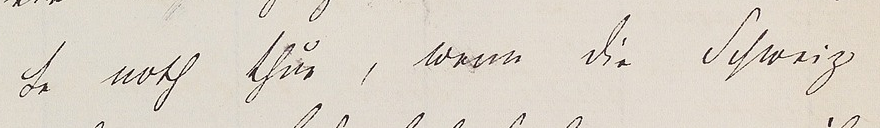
te noth thue, wenn die Schweiz
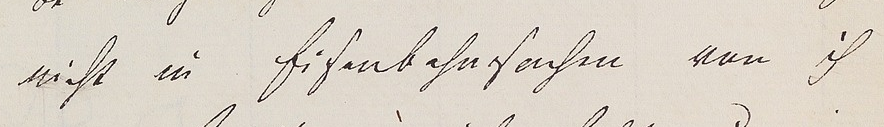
nicht in Eisenbahnsachen von ih-
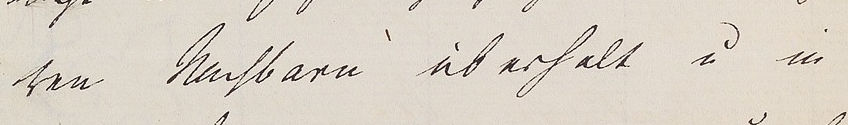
ren Nachbarn überholt u in
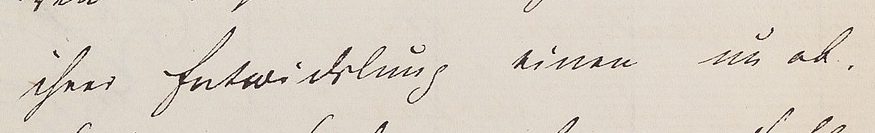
ihrer Entwicklung einen unab-
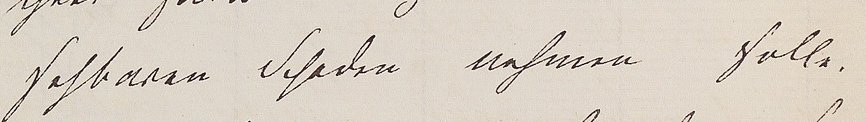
sehbaren Schaden nehmen solle.
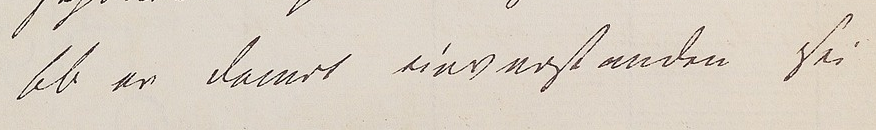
Ob er damit einverstanden sei
